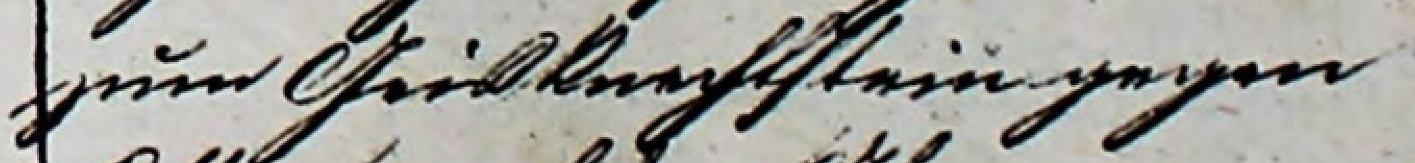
zum Geisknechtstein gegen
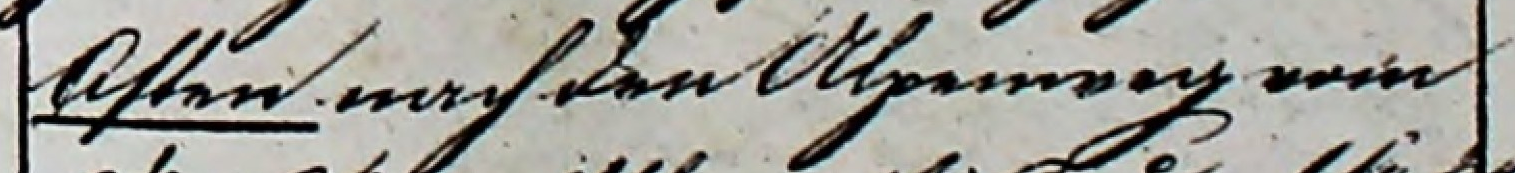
Osten nach den Alpenweg
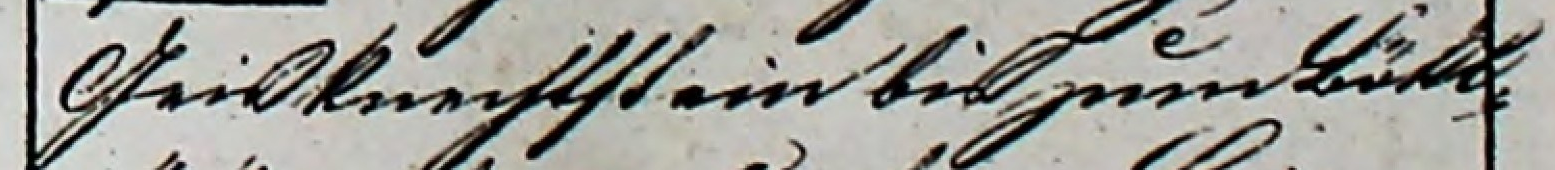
vom
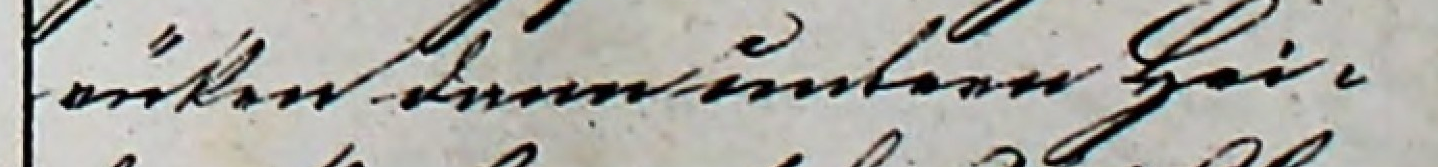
Geisknechtstein bis zum Bökbrüken dam untern Hei„
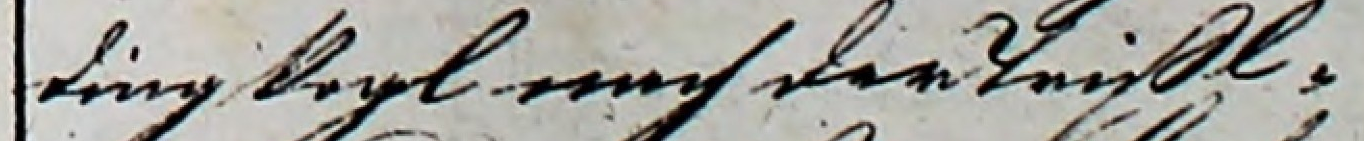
ding Vogl nach der Teißl„
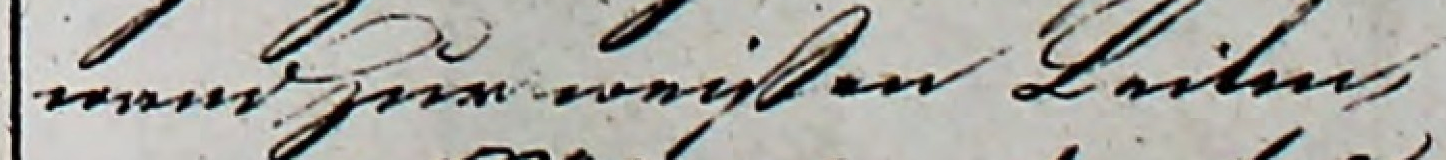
nand zur weißen Leiten,
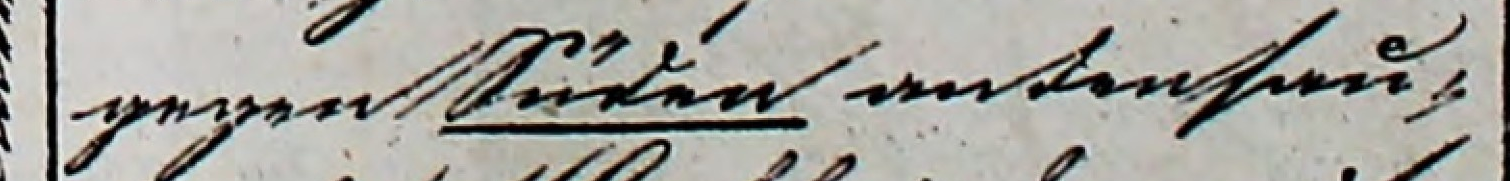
gegen Süden an den sau„
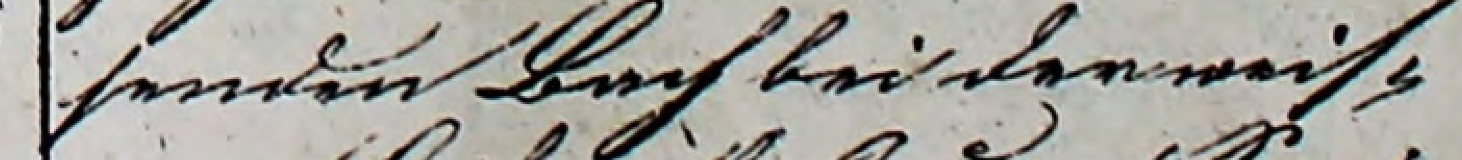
senden Bach bei der weis„
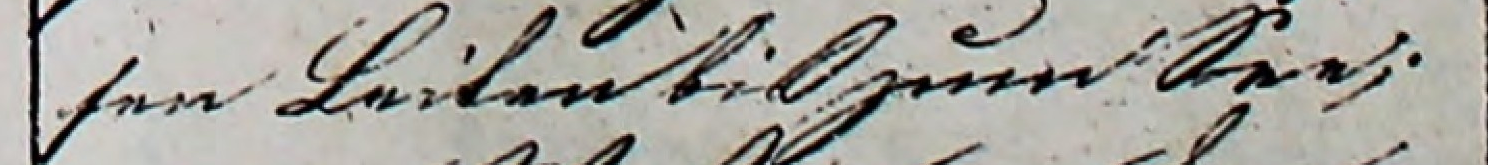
sen Leiten bis zum Sen,
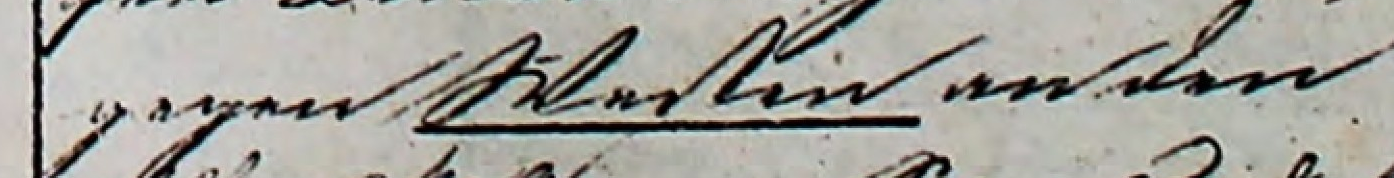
gegen Westen an den
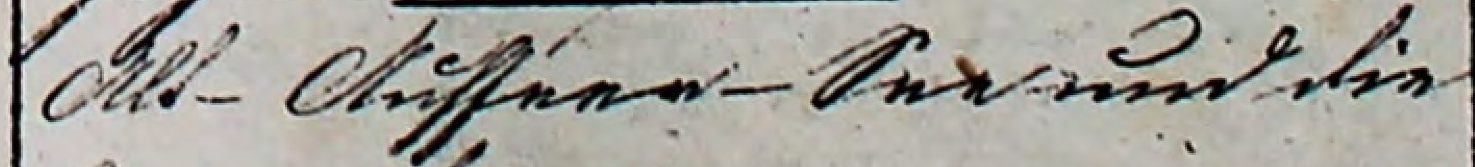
Alt–Ausseer–See und die
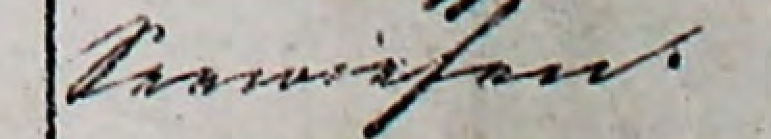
Seewiesen.
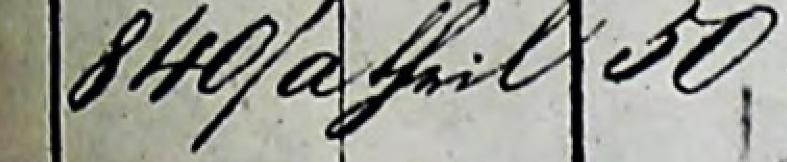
840/a theil 50
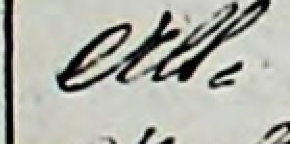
Alt=
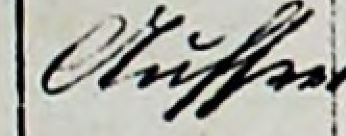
Aussee
